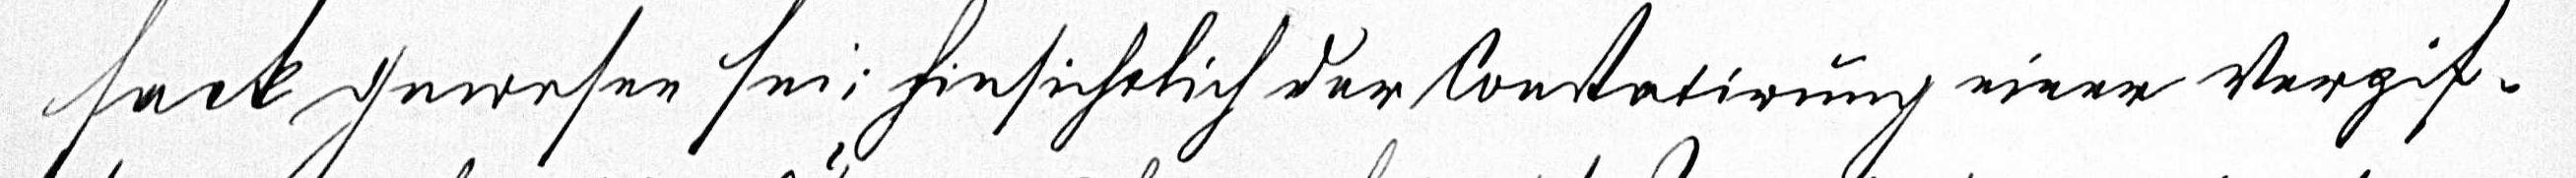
sack gewesen sei; hinsichtlich der Constatirung einer Vergif¬
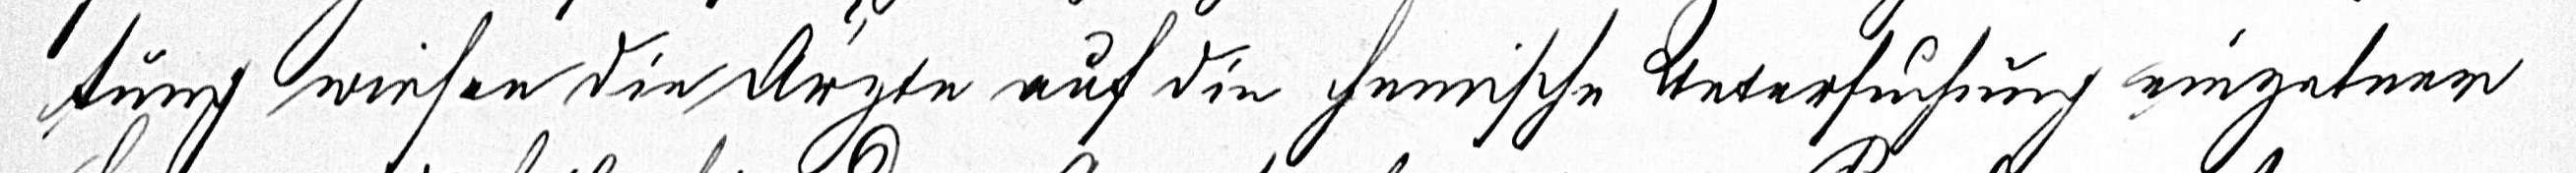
tung wiesen die Ärzte auch die heimische Untersuchung einzelner
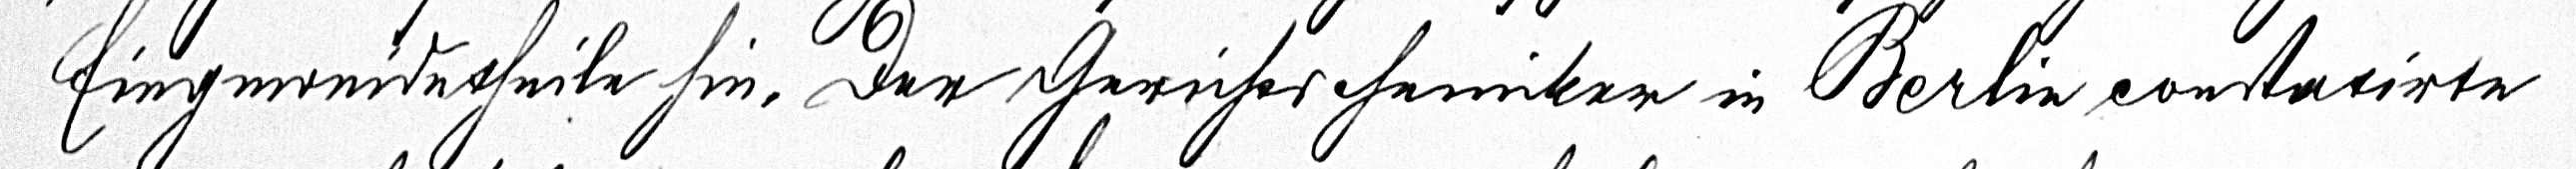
Eingeweidetheile sei. Der Gerichtschemiker in Berlin constatirte
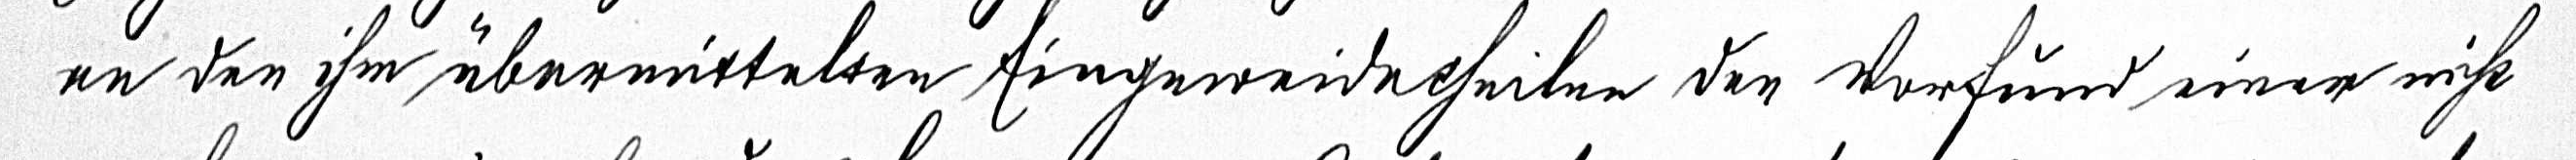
an den ihm übermittelten Eingeweidecheilen den Vorfund einer nicht
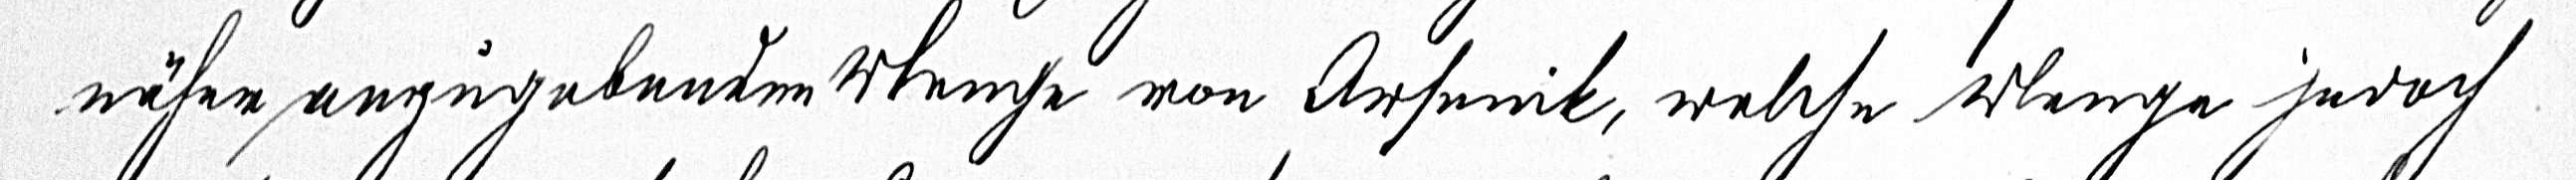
näher anzugebenden Menge von Arsenik, welche Menge jedoch
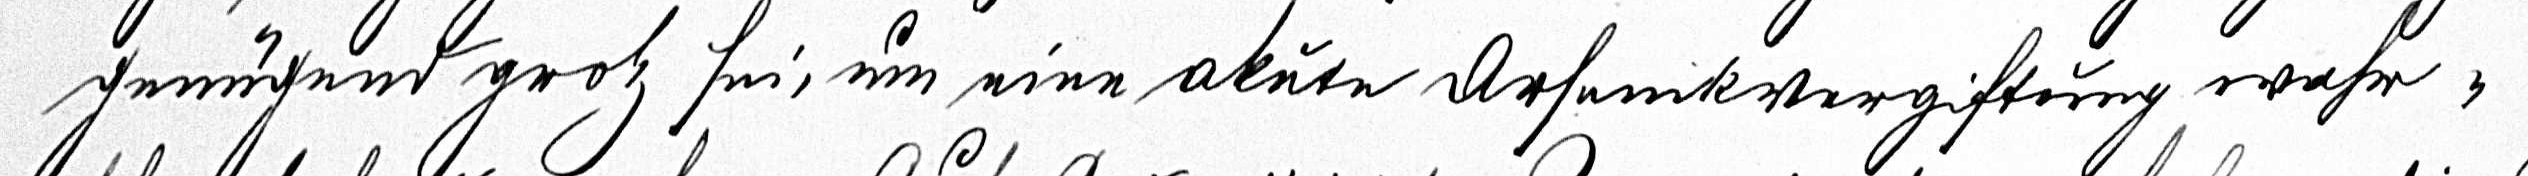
genügend gros sei, um eine akute Arsenikvergfitung, wahr¬
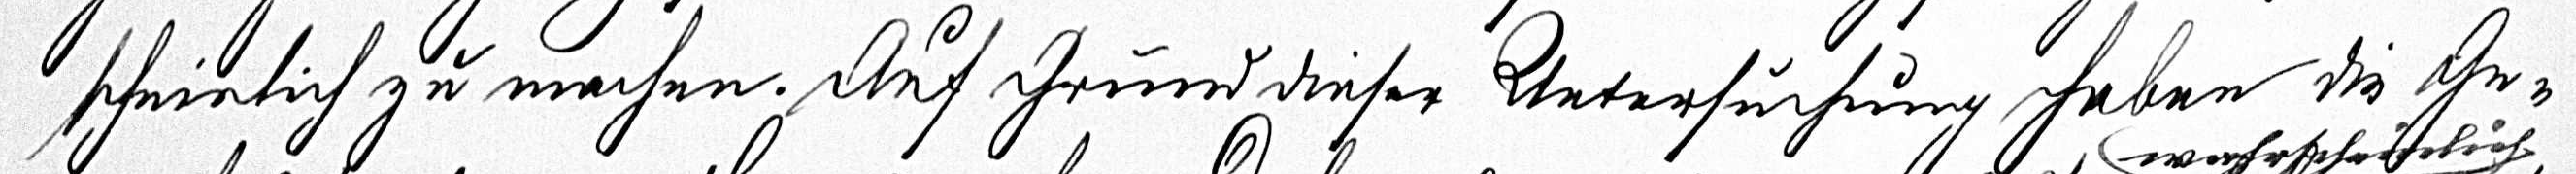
scheinlich zu machen. Auf Grund dieser Untersuchung haben die Ge¬
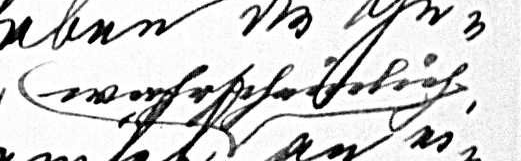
wahrscheinlich
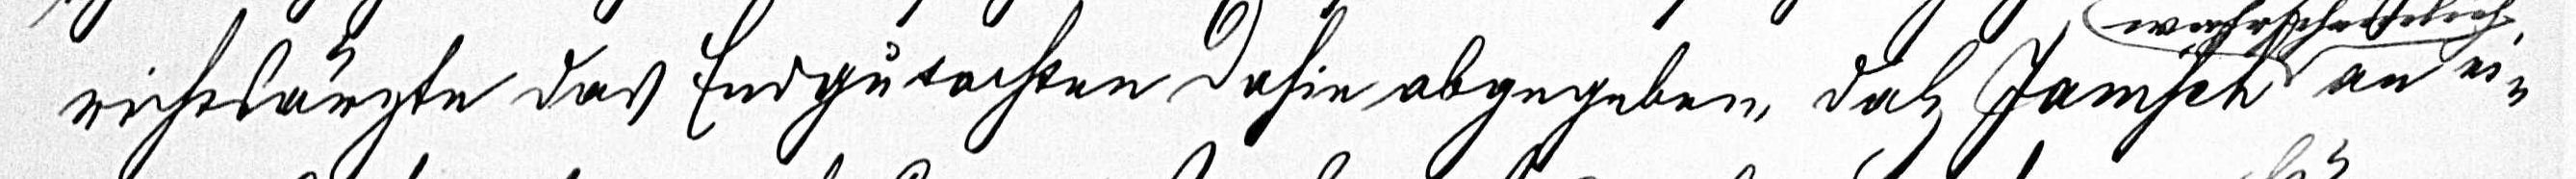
richtsärzte das Endgutachten dahin abgegeben, daß Janisch an ei¬
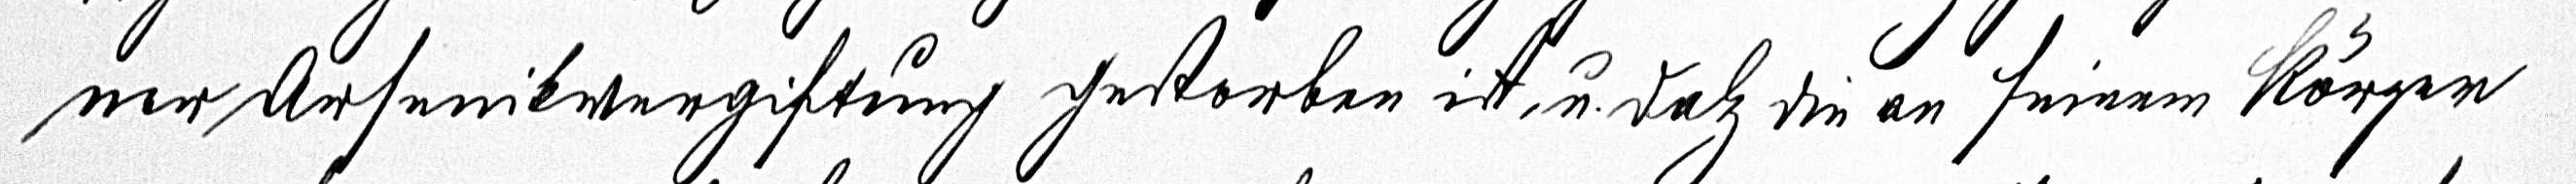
ner Arsenikvergiftung gestorben ist u. daß die an seinem Körper
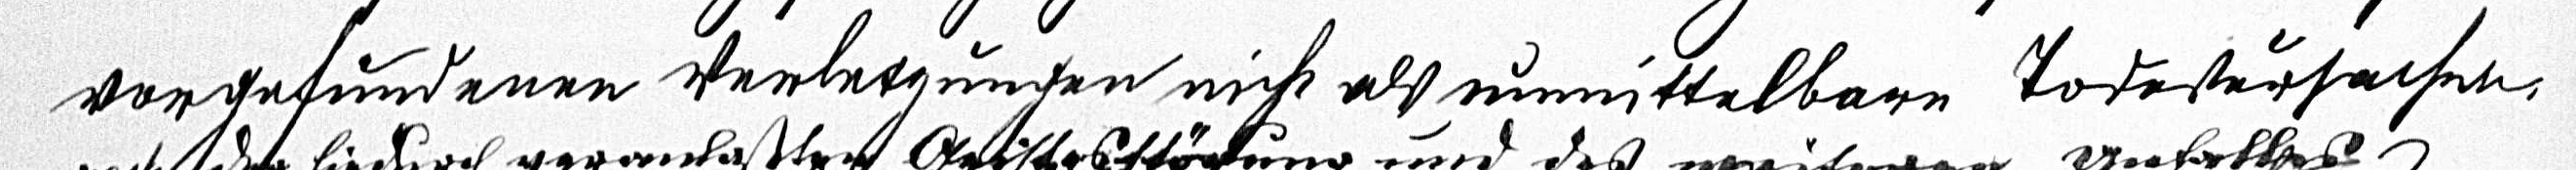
vorgefundenen Verletzungen nicht als unmittelbare Todesursachen
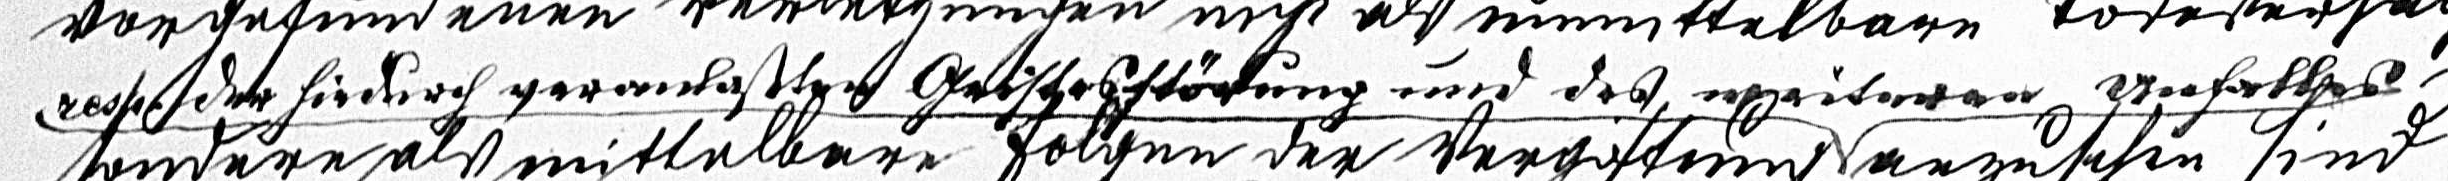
resp. der hindurch veranlaßten Geistesstörung und des weiterer Unfalles
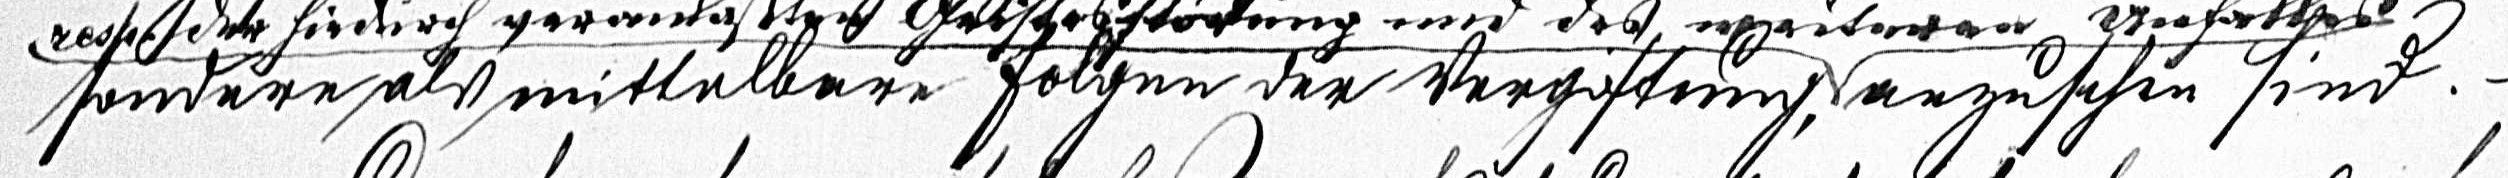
sondern als mittelbare Folgen der Vergiftung, anzusehen sind.
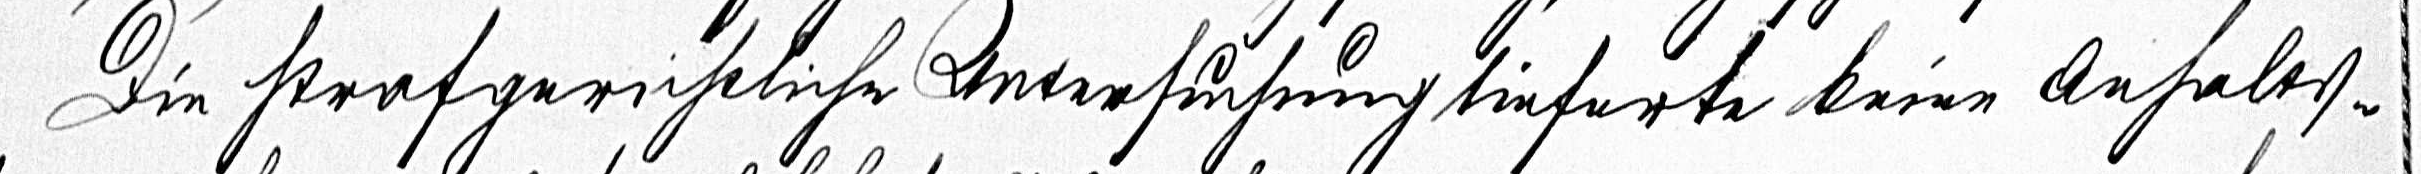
Die strafgerichtiche Untersuchung lieferte keine Anhalts¬
